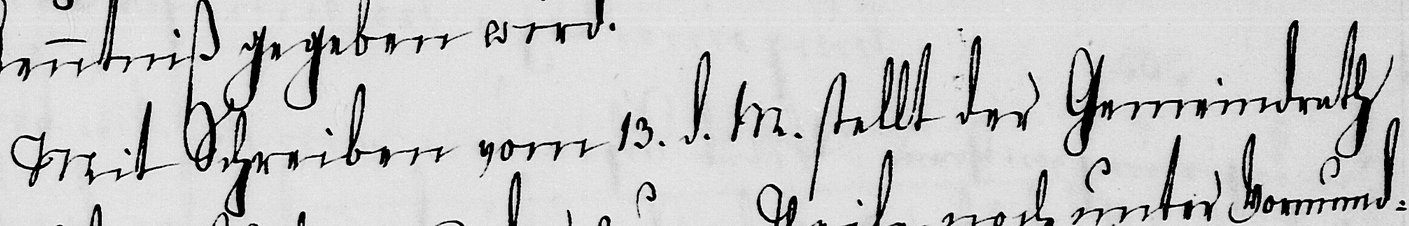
Mit Schreiben vom 13. d. M. stellt der Gemeindrath
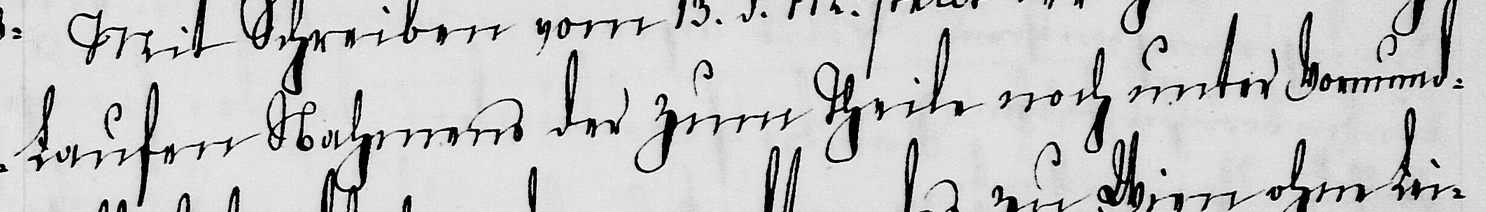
Laufen Nahmens der zum Theile noch unter Vormund¬
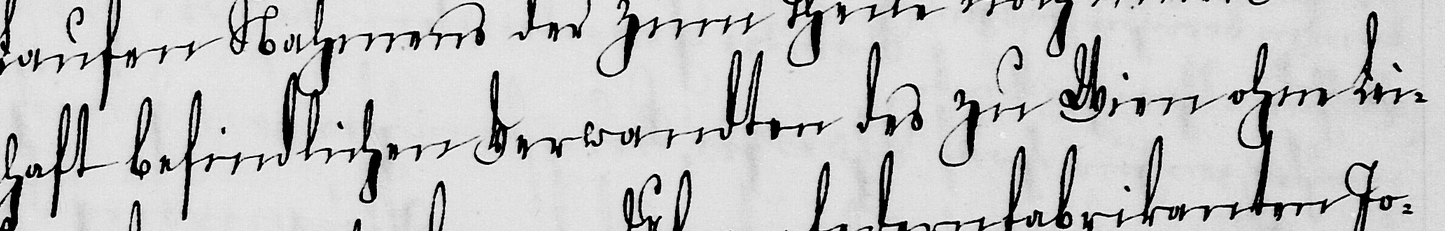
aft befindlichen Verwandten des zu Wien ohne Lei¬
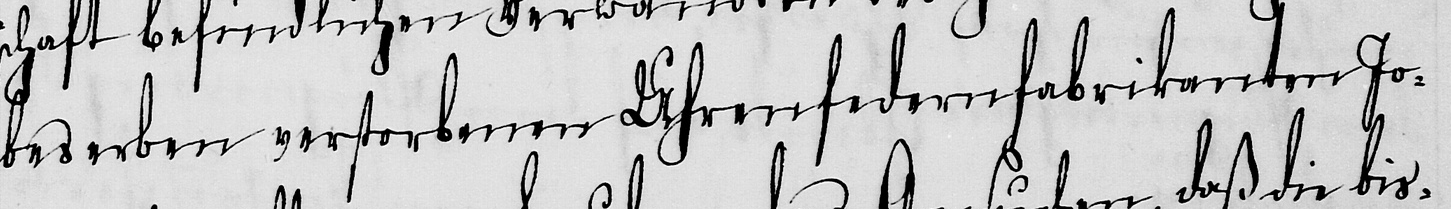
beserben verstorbenen Uhrenfedernfabrikanten Jo¬
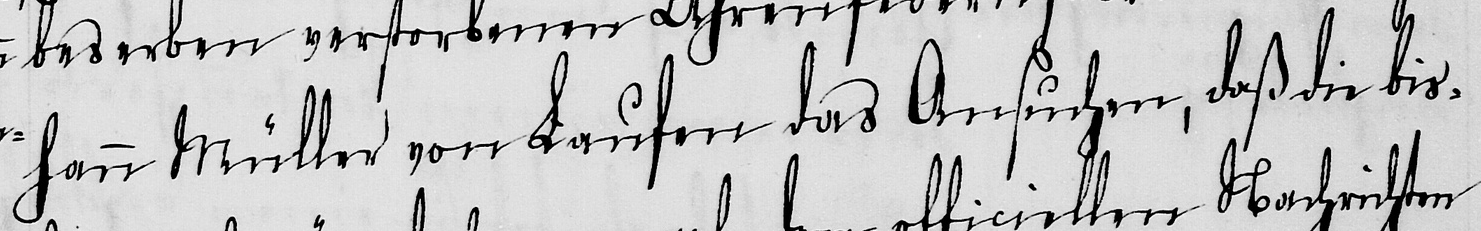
hann Müller von Laufen das Ansuchen, daß die bis¬
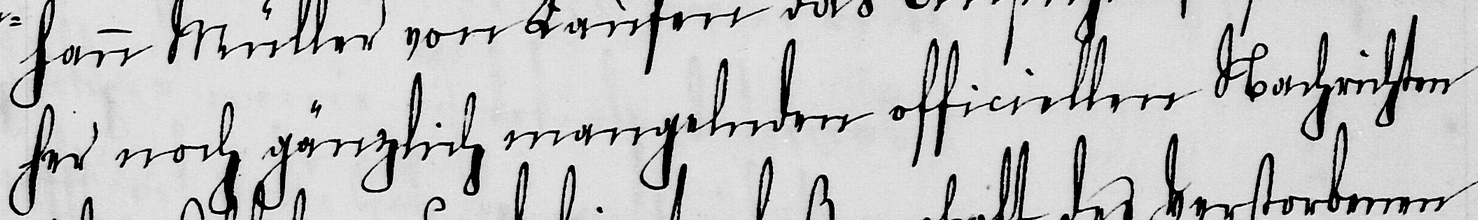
her noch gänzlich mangelnden officiellen Nachrichten
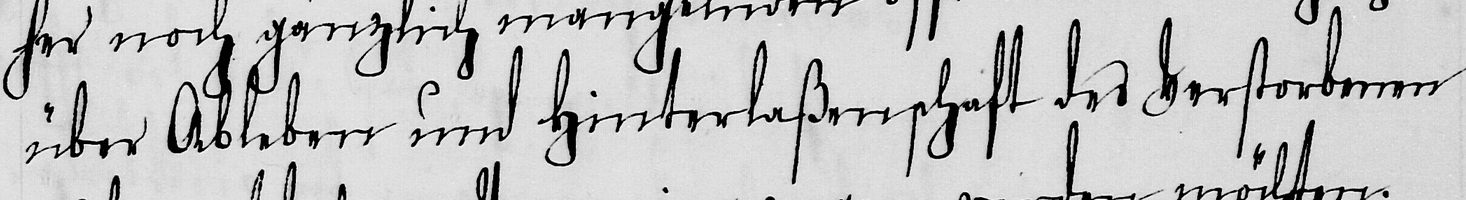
über Ableben und Hinterlaßenschaft des Verstorbenen
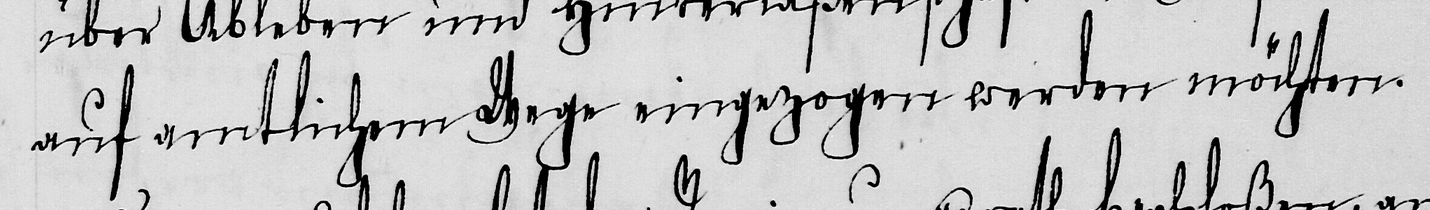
auf amtlichem Wege eingezogen werden möchten.
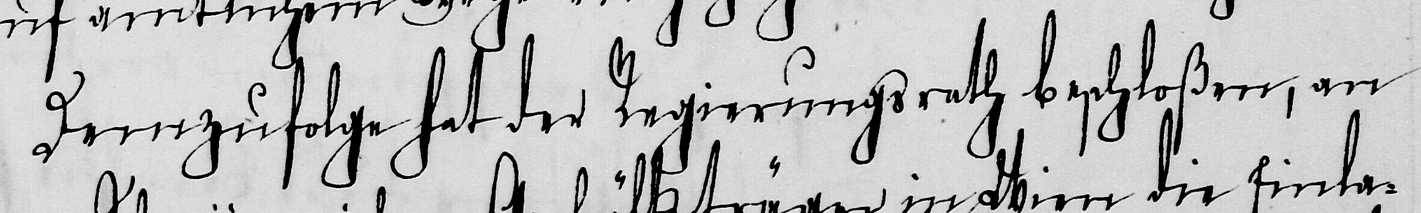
Demzufolge hat der Regierungsrath beschloßen, an
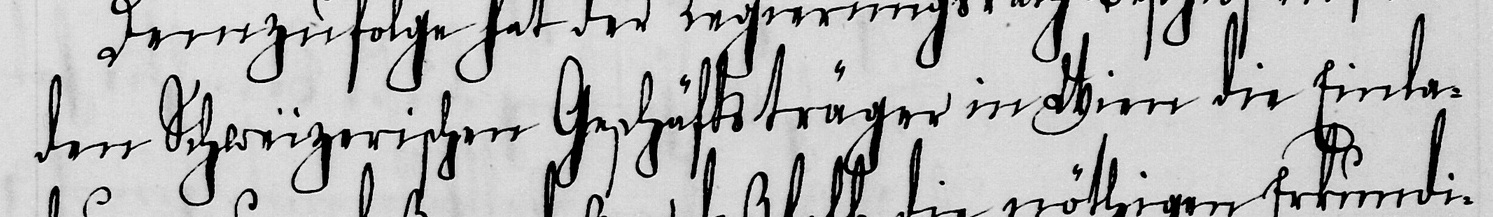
den Schweyzerischen Geschäftsträger in Wien die Einla¬
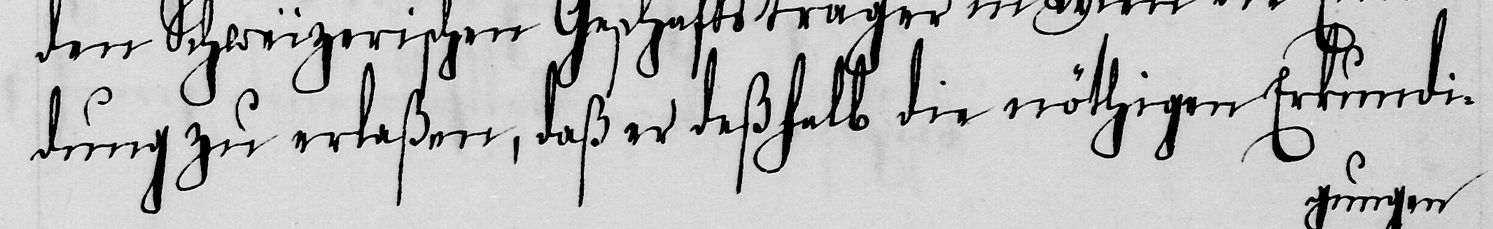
dung zu erlaßen, daß er deßhalb die nöthigen Erkundi-
